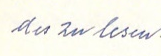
des zu lesen:
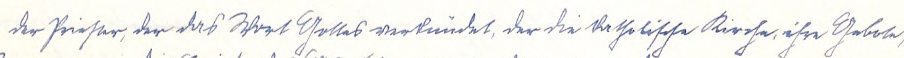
Der Priester, der das Wort Gottes verkündet, der die katholische Kirche, ihre Gebote,
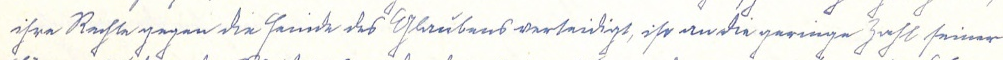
ihre Rechte gegen die Feinde des Glaubens verteidigt, ist an die geringe Zahl seiner
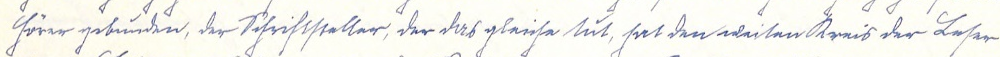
Hörer gebunden, der Schriftsteller, der das gleiche tut, hat den weiten Kreis der Leser
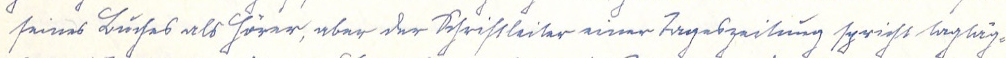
seines Buches als Hörer, aber der Schrifleiter einer Tageszeitung spricht tagtäg-
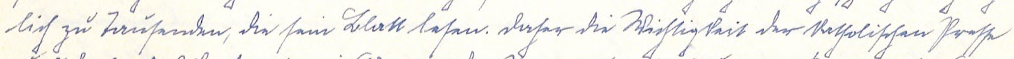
lich zu Tausenden, die sein Blatt lesen. Daher die Wichtigkeit der katholischen Presse
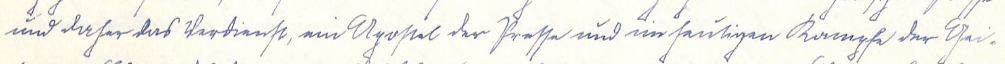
und daher das Verdienst, ein Apostel der Presse und im heutigen Kampfe der Gei-
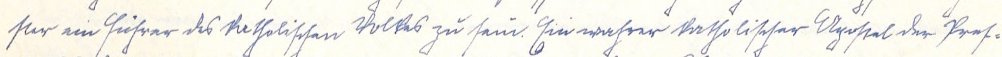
ster ein Führer des katholischen Volkes zu sein. Ein wahrer katholischer Apostel der Pres-
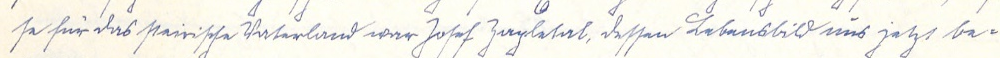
se für das steirische Vaterland war Josef Zapletal, dessen Lebensbild uns jetzt be-
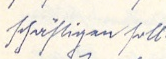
schäftigen soll.
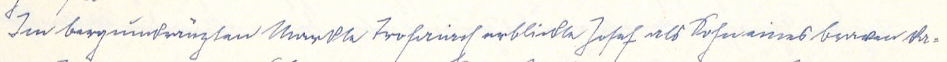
Im bergumkränzten Markte Trofaiach erblickte Josef als Sohn eines braven ka-
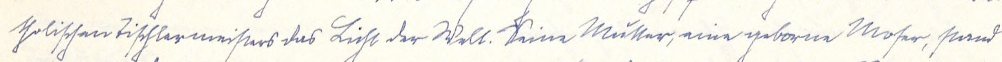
tholischen Tischlermeisters das Licht der Welt. Seine Mutter, eine geborene MOser, stand
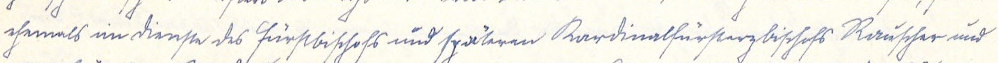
ihrmals im Dienste des Fürstbischofs und späteren Kardinalfürsterbischofs Rauscher und
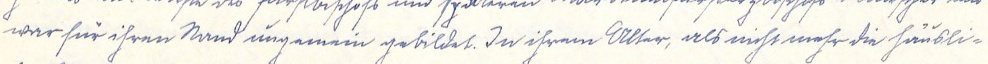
war für ihren Stand ungemein gebildet. In ihrem Alter, als nicht mehr die häusli-
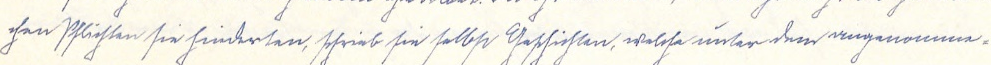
chen Pflichten sie hinderten, schrieb sie selbst Geschichten, welche unter dem angenommen-
